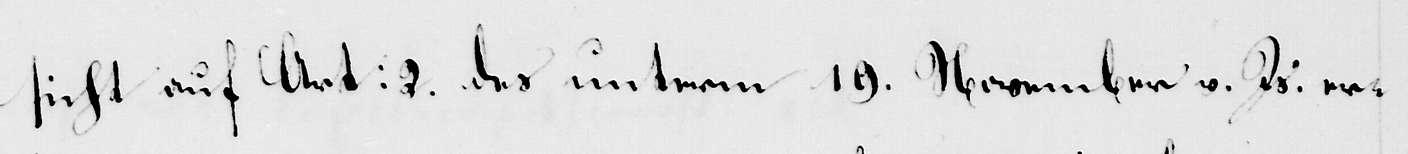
sicht auf Art: 2. des unterm 19. November v. Js. er¬
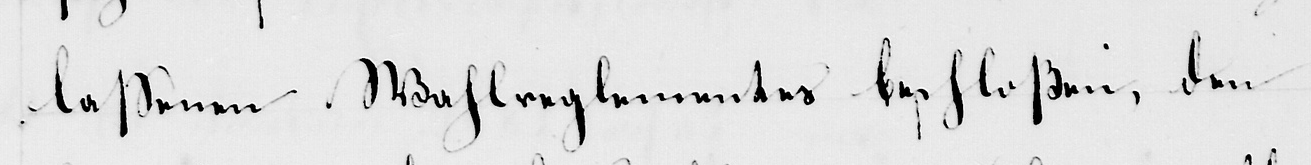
laßenen Wahlreglementes beschloßen, den
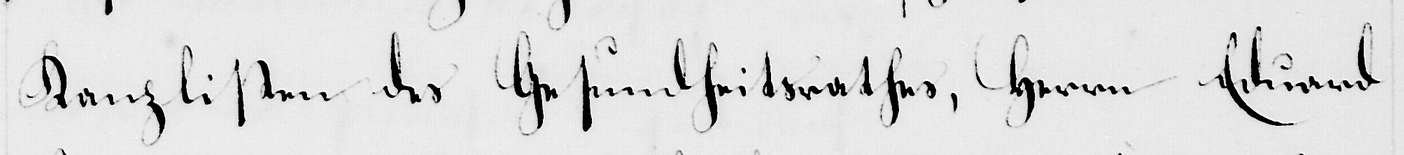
Kanzlisten des Gesundheitsrathes, Herrn Eduard
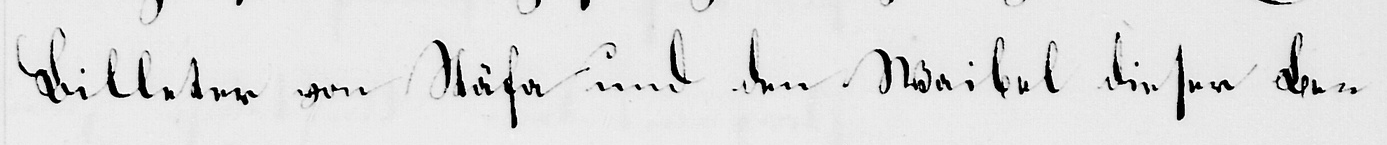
Billeter von Stäfa und den Waibel dieser Be¬
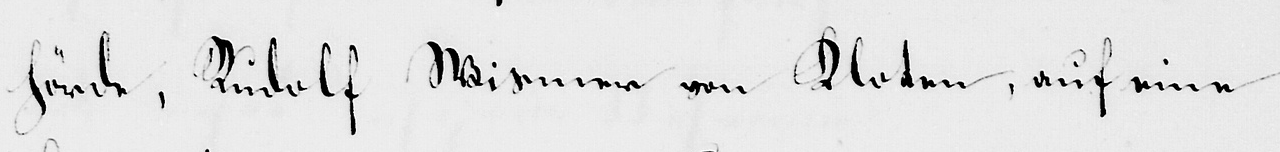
hörde, Rudolf Wismer von Kloten, auf eine
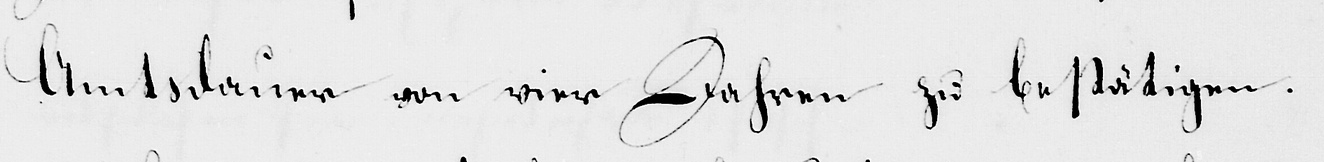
Amtsdauer von vier Jahren zu bestätigen.
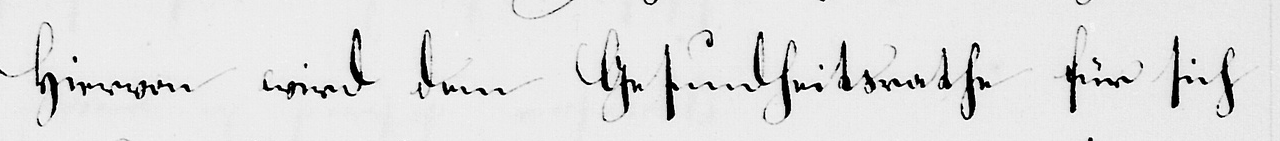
Hiervon wird dem Gesundheitsrathe für sich
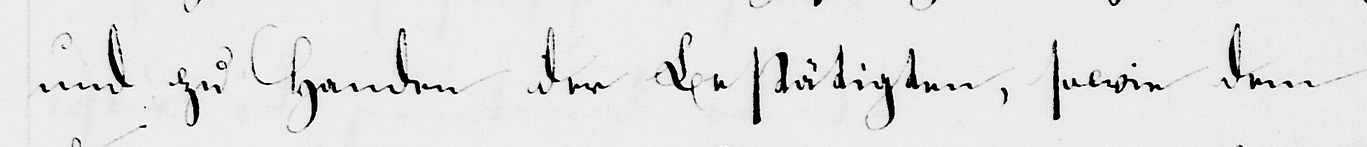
und zu Handen der Bestätigten, sowie dem
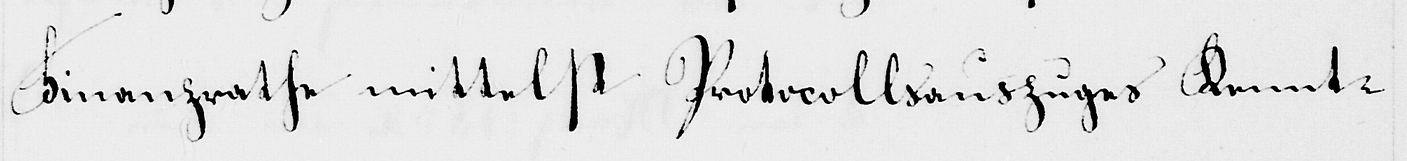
Finanzrathe mittelst Protocollsauszuges Kennt¬
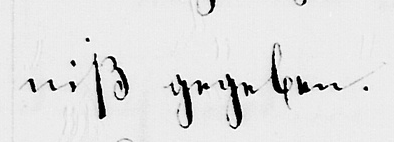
niß gegeben.
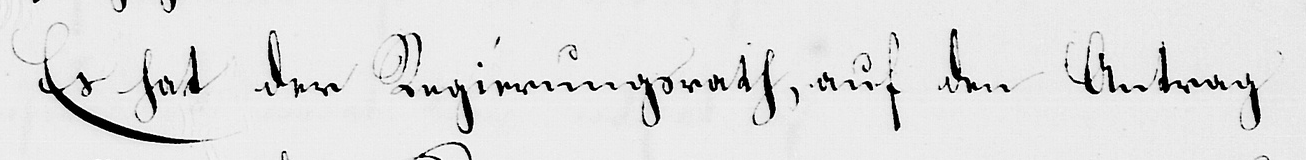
Es hat der Regierungsrath, auf den Antrag
